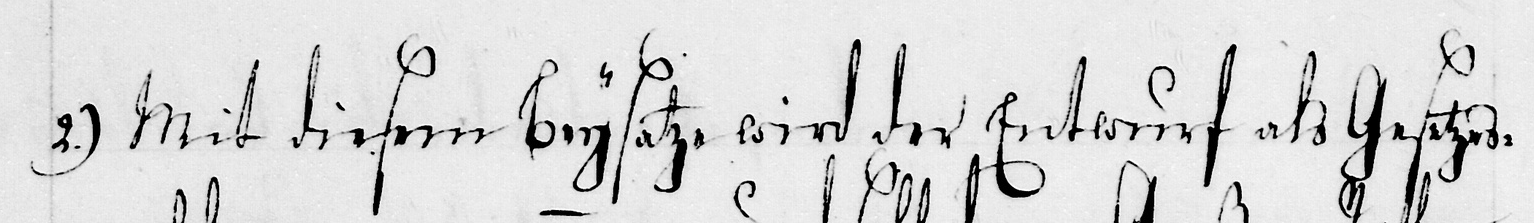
2.) Mit diesem Beysatze wird der Entwurf als Gesetz¬
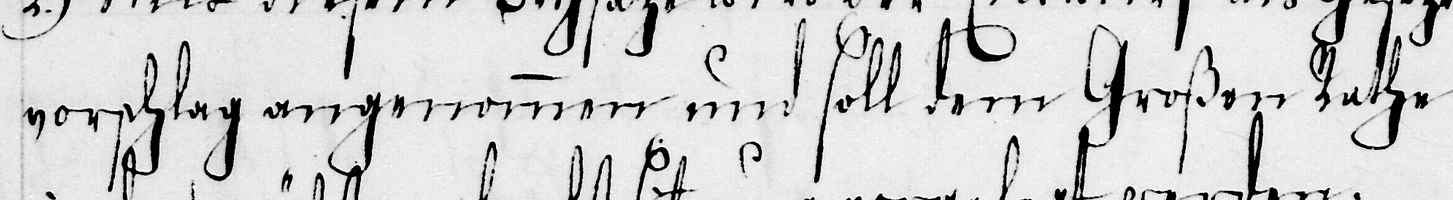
vorschlag angenommen und soll dem Großen Rathe
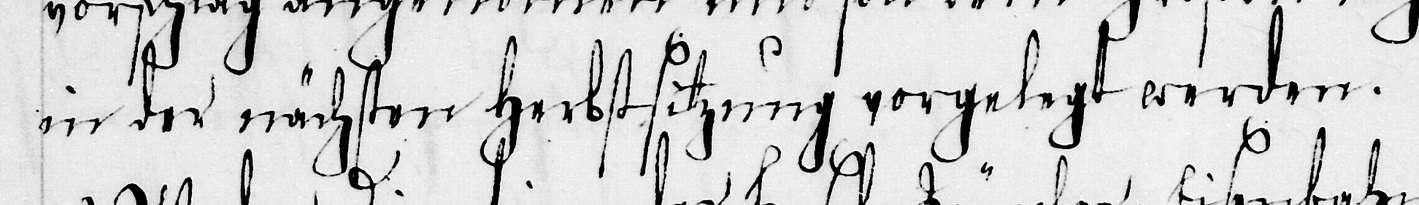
in der nächsten Herbstsitzung vorgelegt werden.
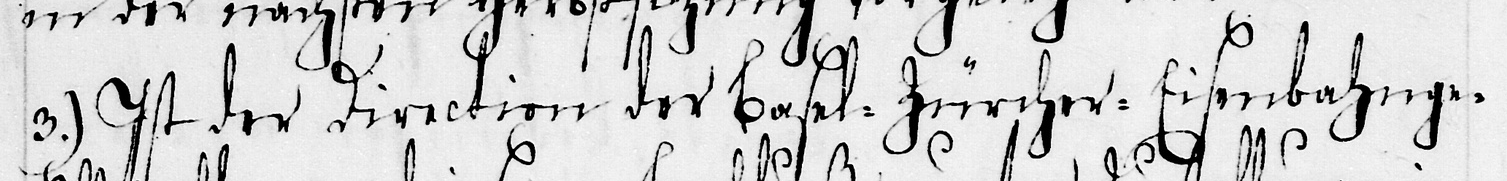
3.) Ist der Direction der Basel-Zürcher-Eisenbahnges¬
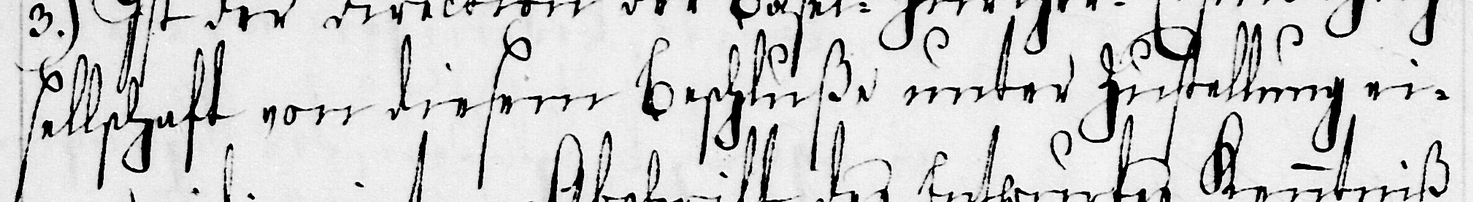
ellschaft von diesem Beschluße unter Zustellung ei¬
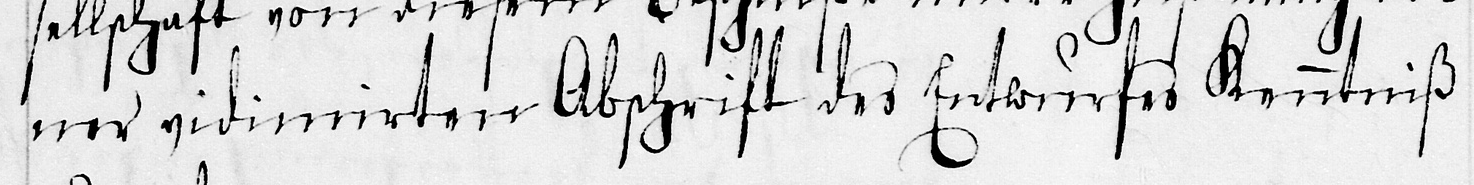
ner vidimirten Abschrift des Entwurfes Kenntniß
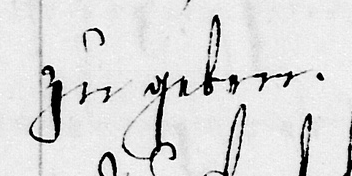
zu geben.
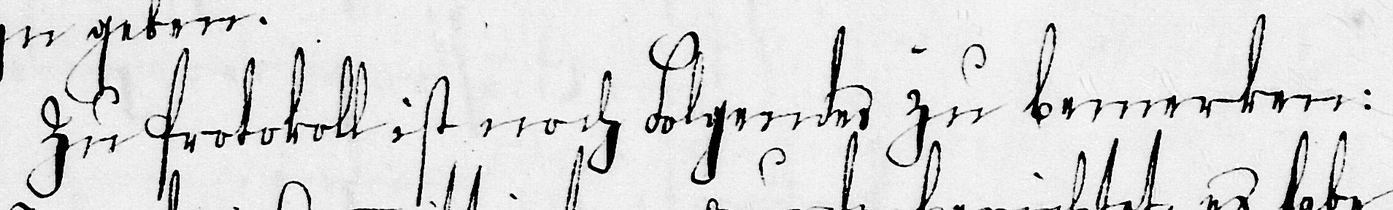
Zu Protokoll ist noch Folgendes zu bemerken:
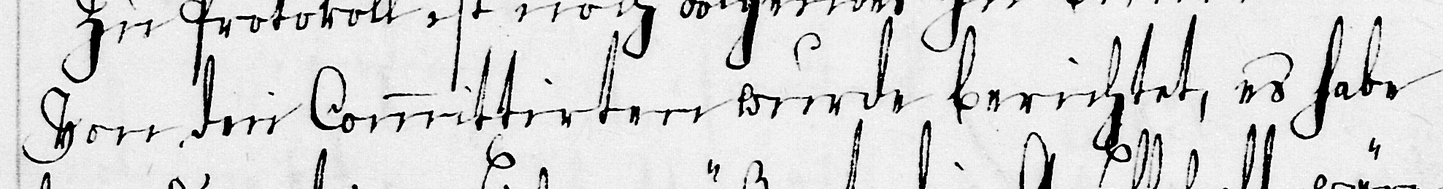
Von den Committirten wurde berichtet, es habe
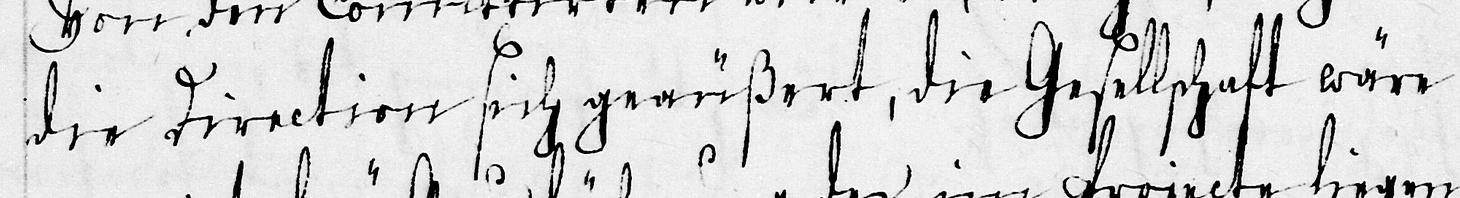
die Direction sich geäußert, die Gesellschaft wäre
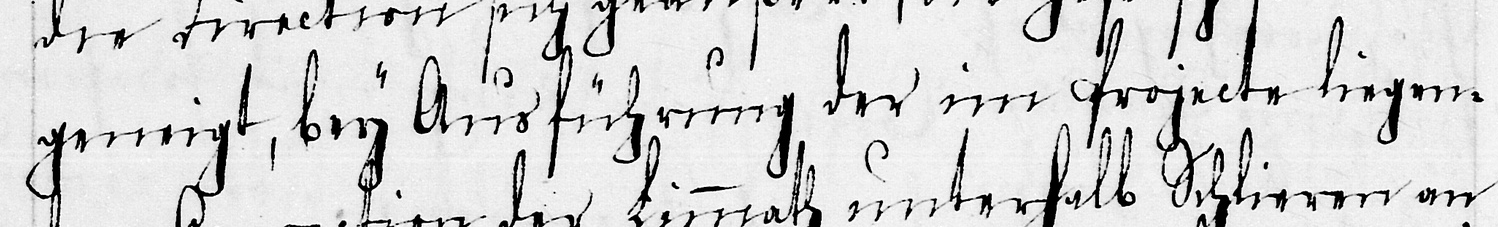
geneigt, bei Ausführung der im Projecte liegen¬
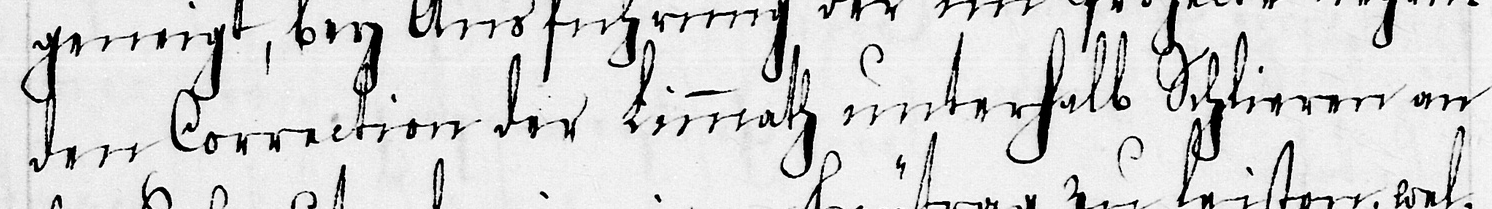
den Correction der Limmath unterhalb Schlieren an
